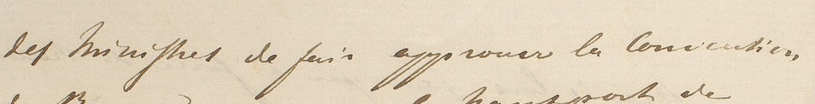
des Ministres de fair approuer la Convention
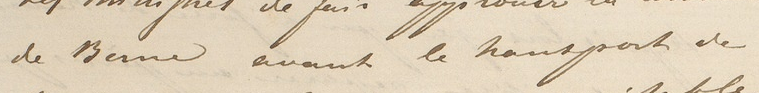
de Berne avant le transport de
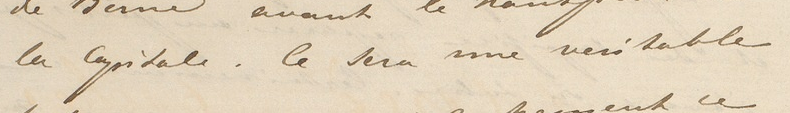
la Capitale. Ce sera une veritable
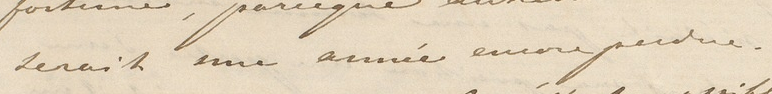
serait une année encore perdue.
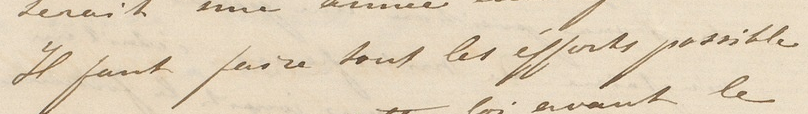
Il faut faire tout les éfforts possible
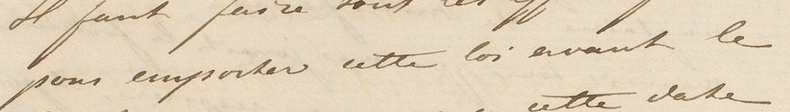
pour emporter cette loi avant le
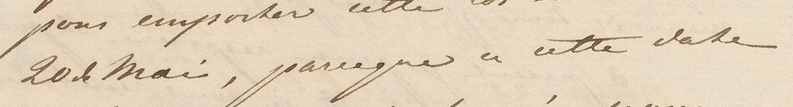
20 de Mai, parceque a cette date
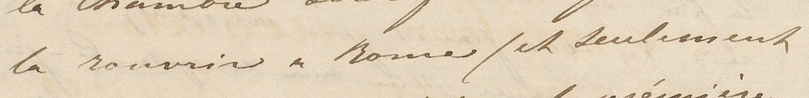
la rouvrir a Rome (et seulement
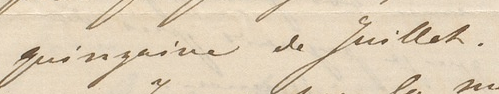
quinzaine de Juillet.
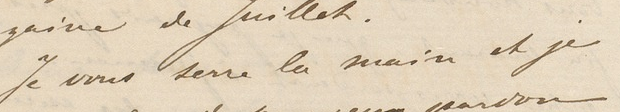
Je vous serre la main et je
